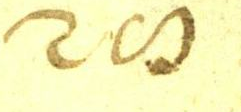28
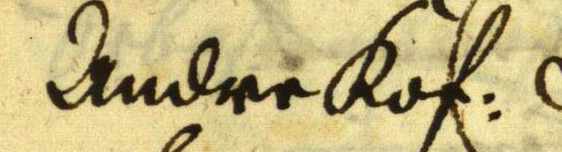Andre Kof¬
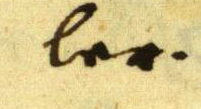ler.
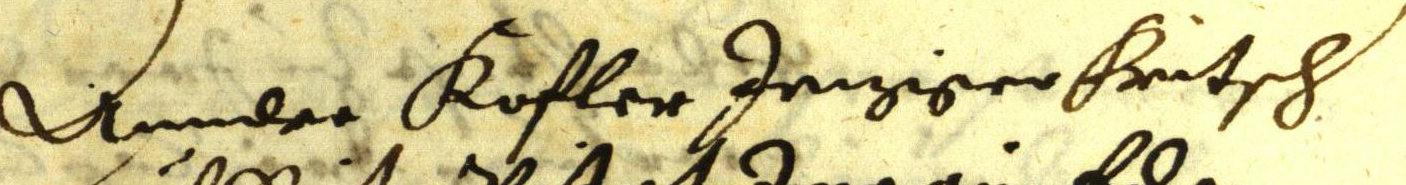Anndre Kofler Jetziger Fritsch
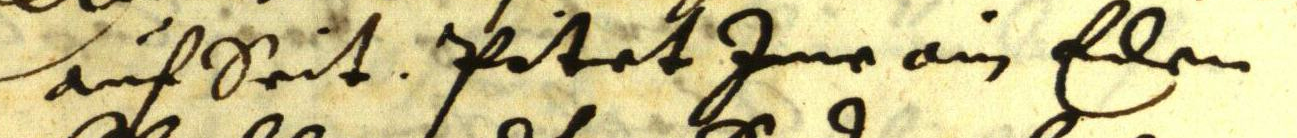aūf Seit. Pitet Ime ain Edlen
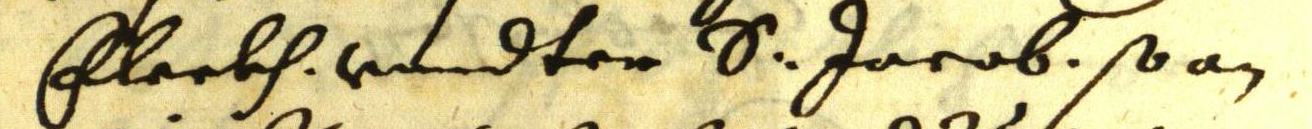Fleckh. vndter S: Jacob. so an
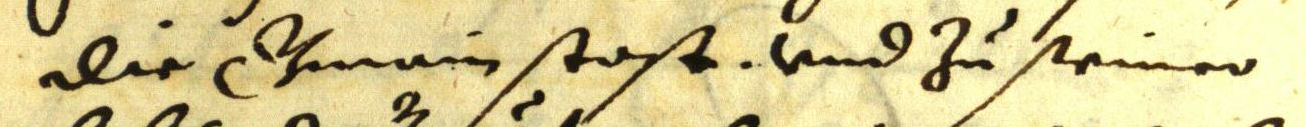die Gmain stost. vnd Zū seiner
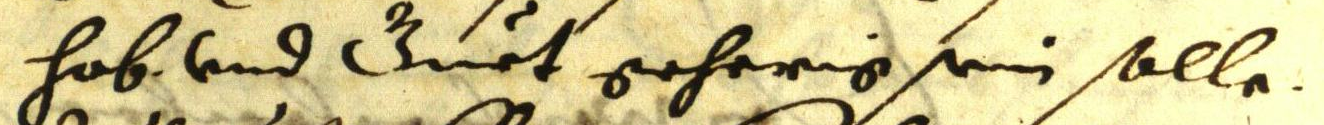hab. vnd Gūet geherig sein solle.
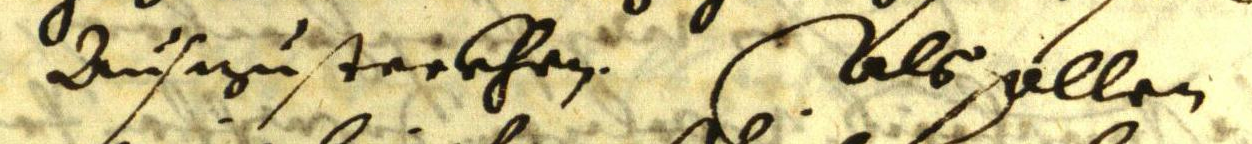Aūszūsteckhen. Als sollen
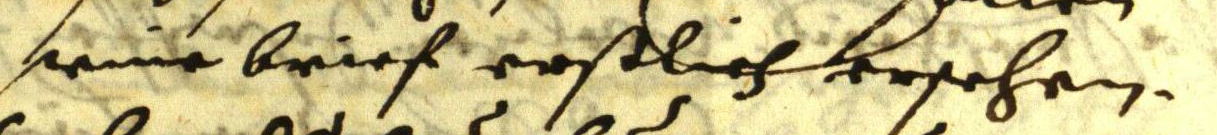seine brief erstlich ersehen.
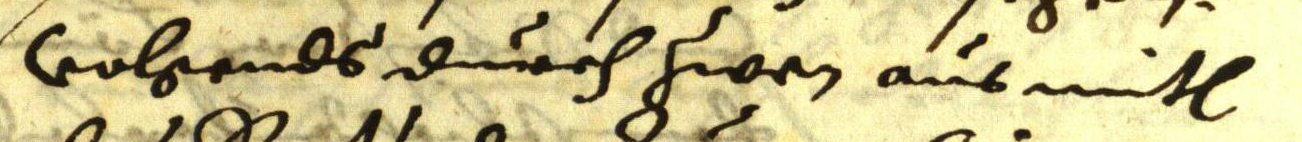volgends dūrch Zwen aūs mitl
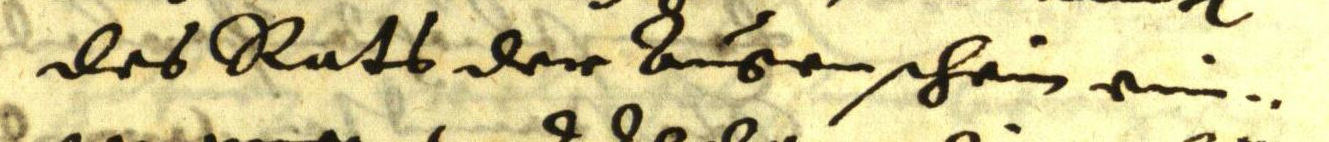des Rats der Aūgenschein ein¬
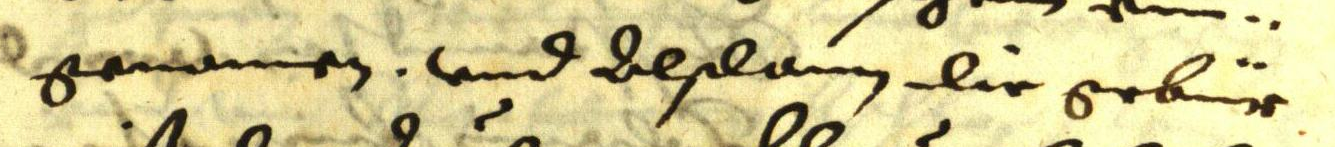genomen. vnd Alsdann die gebür
